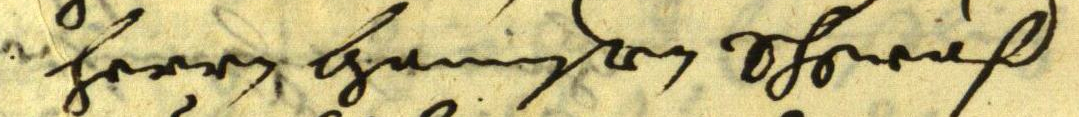herrn Hannsen Schgraf
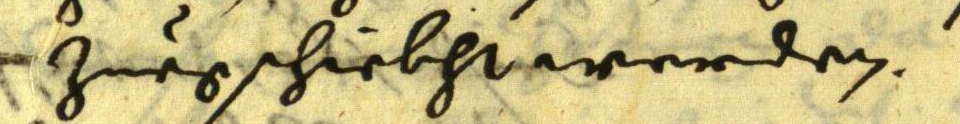Zūegschickht werden.
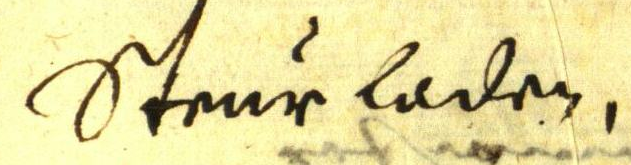Steūr laden,
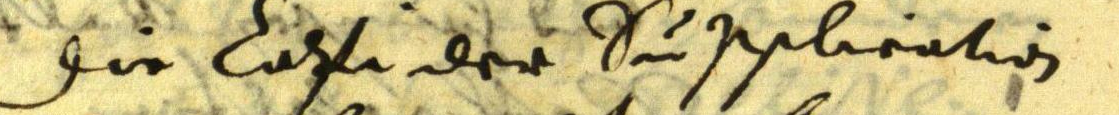Die CoPi der Sūpplication
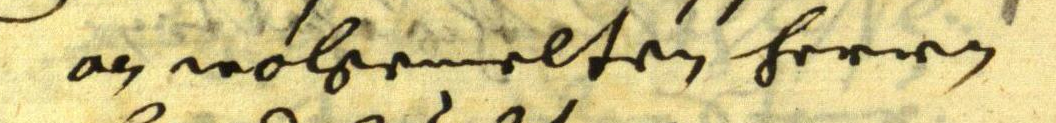an wolgemelten herrn
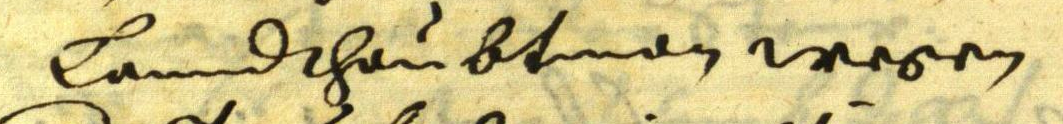Lanndthaūbtman wegen
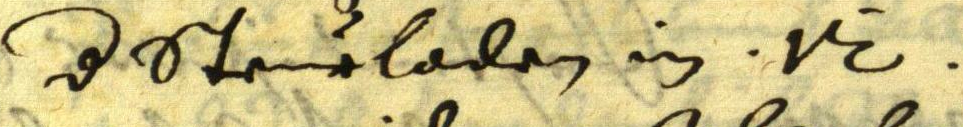d Steūrladen in .12.
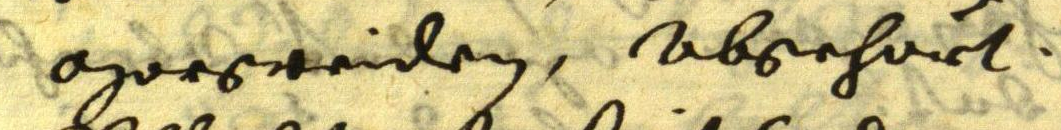Margreiden, Abgehōrt.
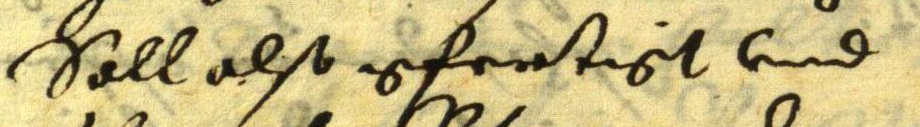Soll also gfertigt vnd
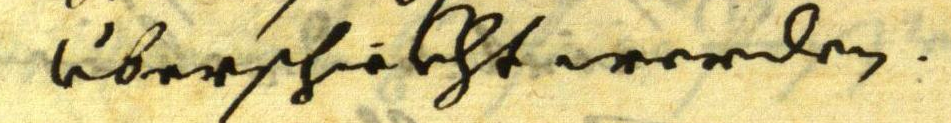v̄berschickht werden.
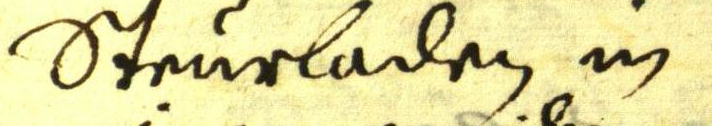Steūrladen in
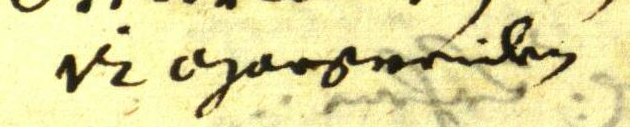12 Margreiden
